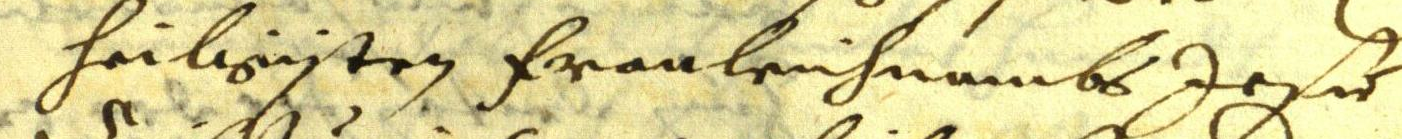heiligisten fronleichnambs Jesu
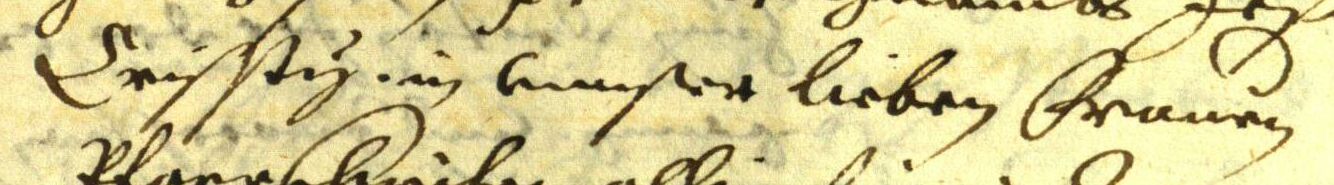Crisstȳ. in vnnser lieben Fraūen
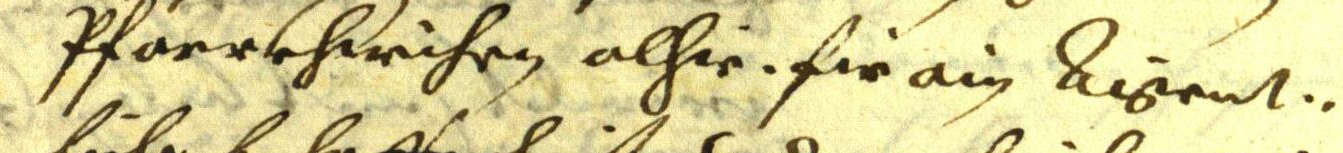Pfarrkhirchen alhie. fir ain Aigent¬
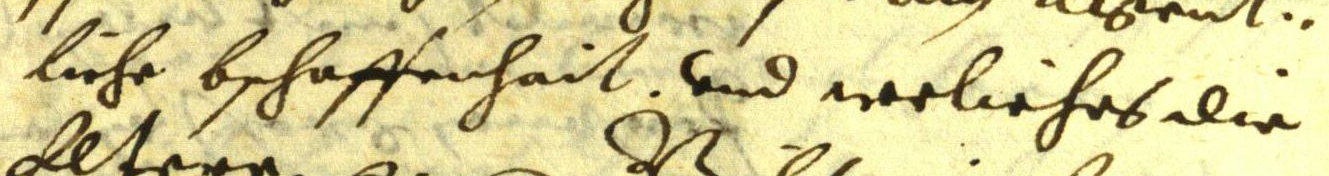liche bschaffenhait. vnd weliches die
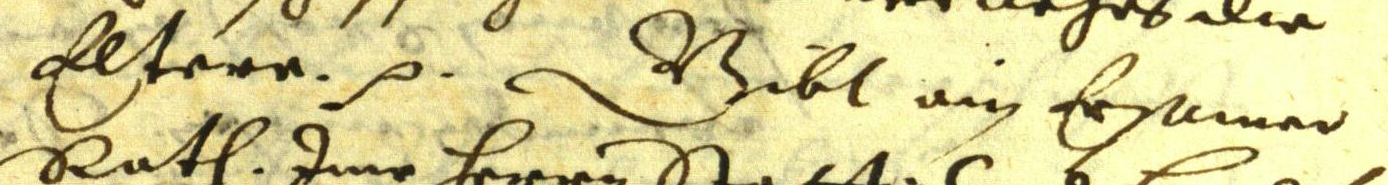Eltere. etc. Gibt ain Ersamer
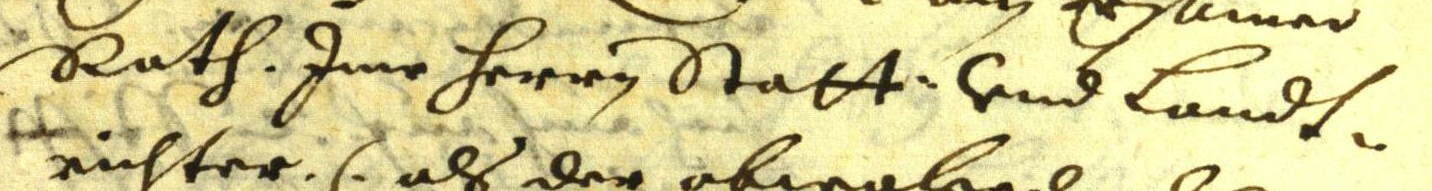Rath Ime herrn Statt- vnd Landt¬
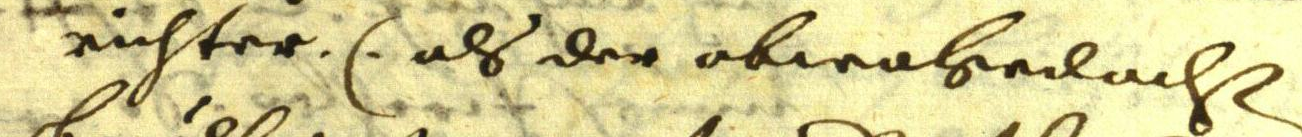richter .(.als der obwolgedacht
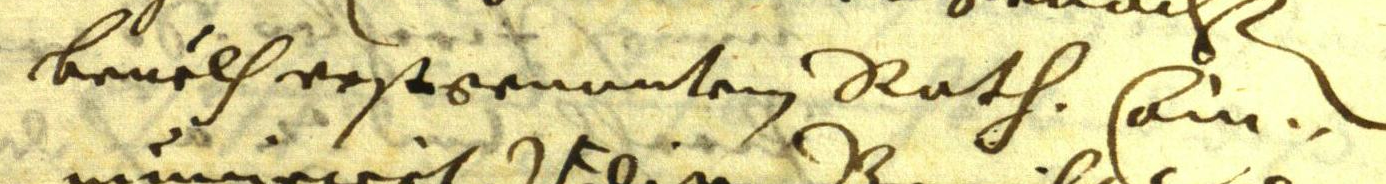beūelch eest genanntem Rath. Com¬
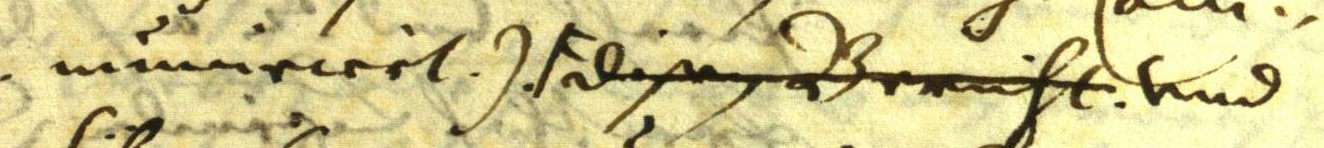mūniciert.). disem Bericht. vnd
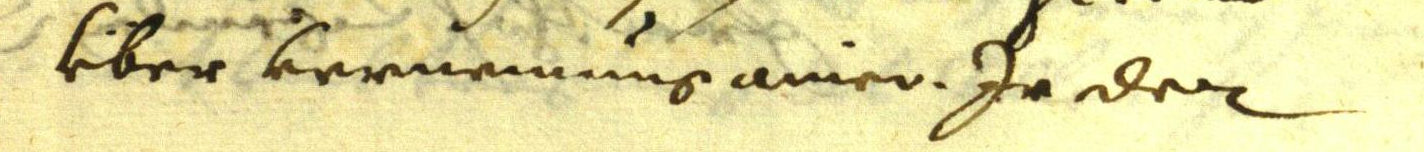v̈ber vernemūng ainer. Ir der
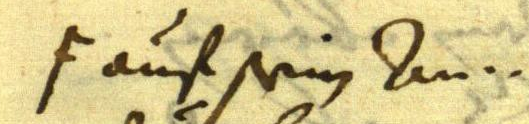aūf sein An-
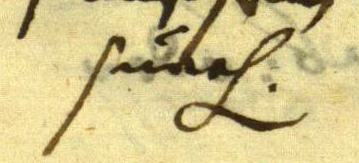such.
